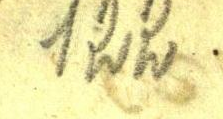122
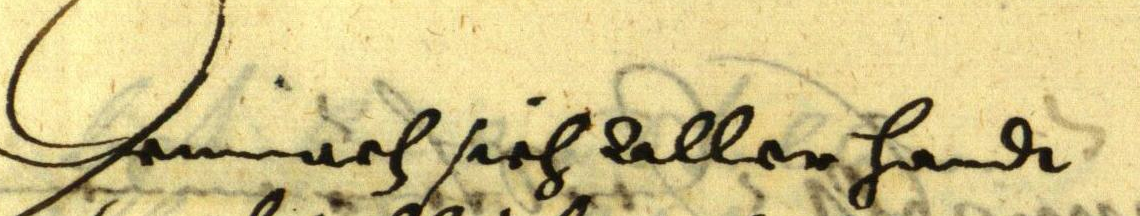Demnach sich Aller handt
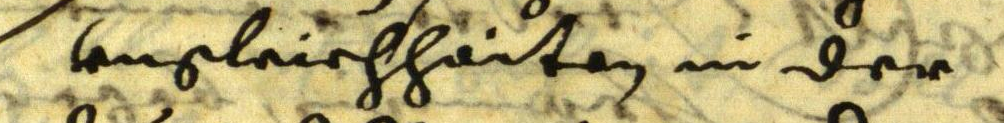vngleichhaiten in der
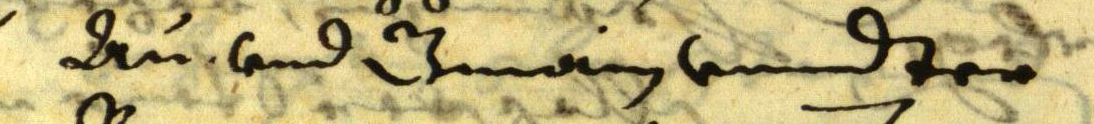Aū. vnd Gmain vnndter
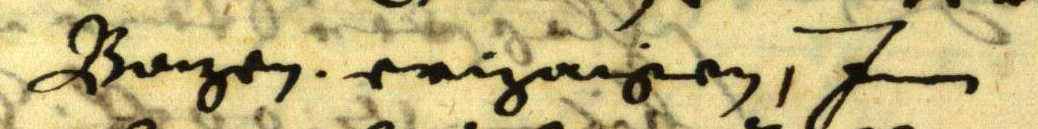Bozen. erzaigen, Inn
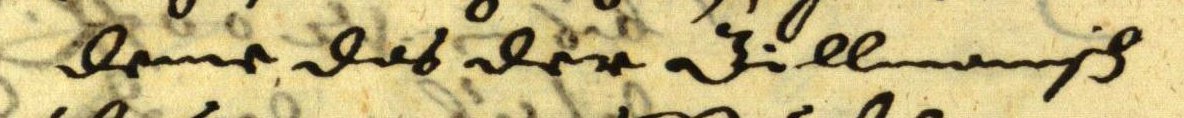deme das der Gillmanisch
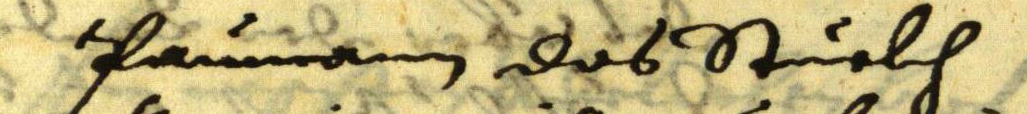Paūmann das Stūckh
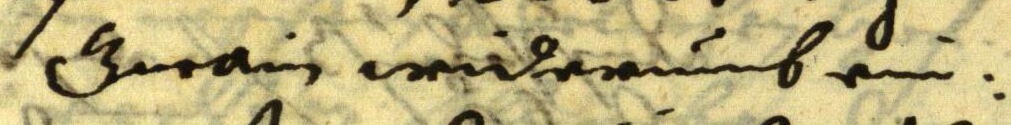Gmain widerūmb ein¬
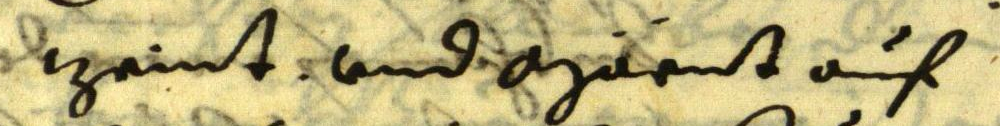zeint. vnd Mäent aūf
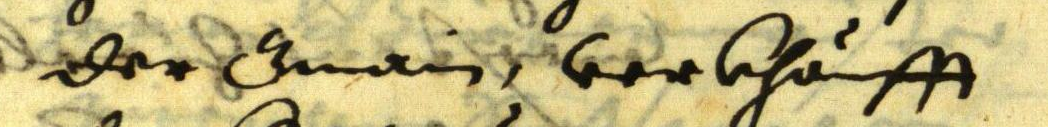der Gmain, verkhaūfft
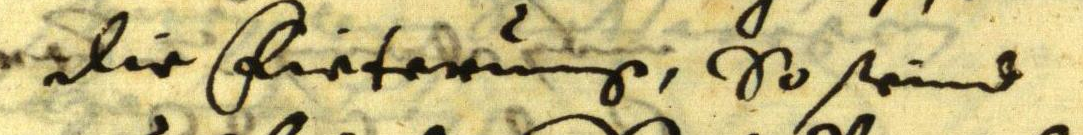die Fieterūng, So seind
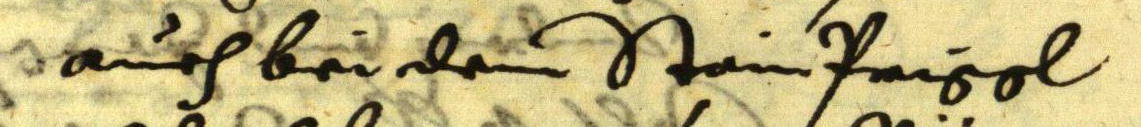auch bei dem Stain Paiggl
